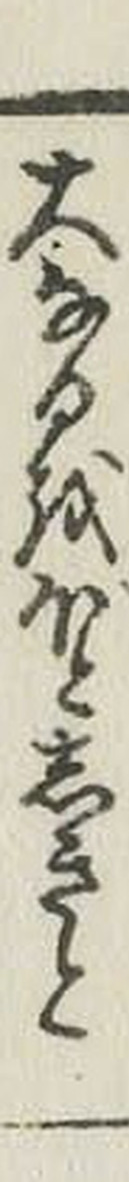大なるをぼとしきと
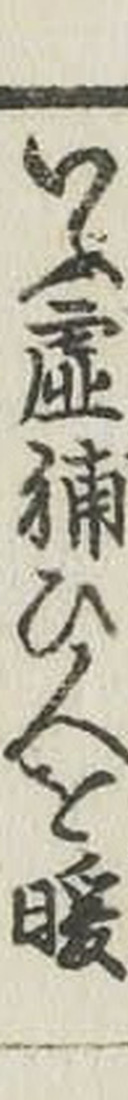いふ虚補ひ人を暖
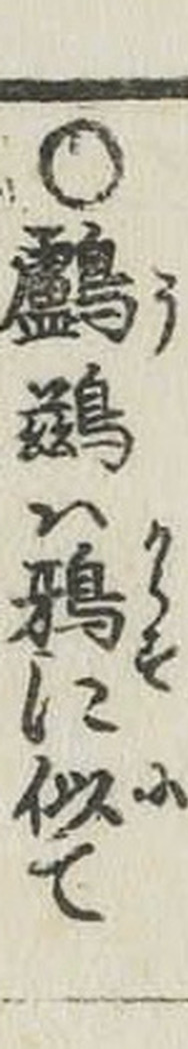○鸕鷀は鴉に似て
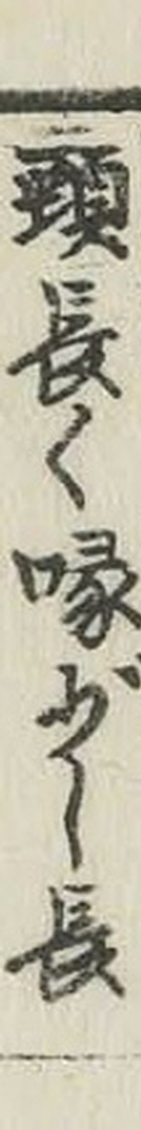頸長く喙少し長
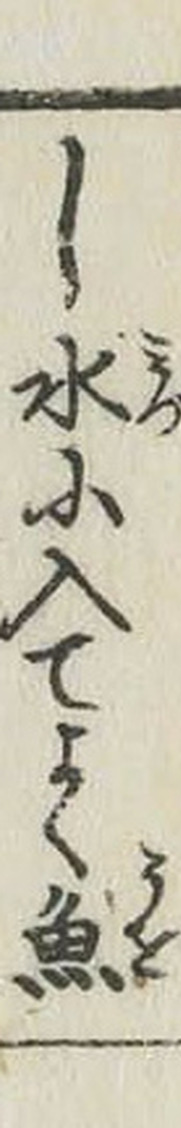し水に入てよく魚
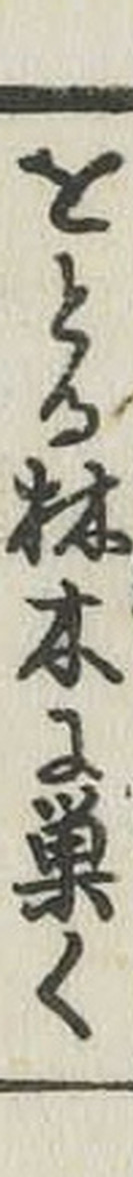をとる林木に巣く
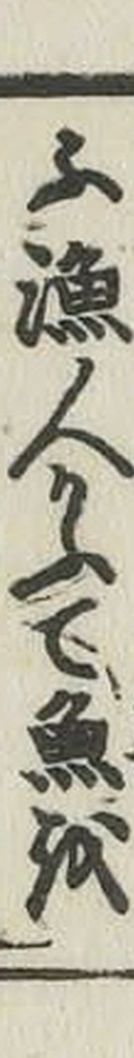ふ漁人かふて魚を
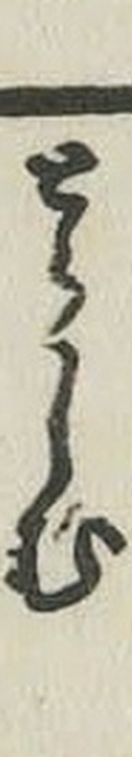とらしむ

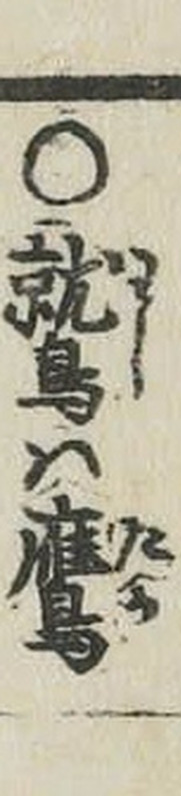○鷲は鷹
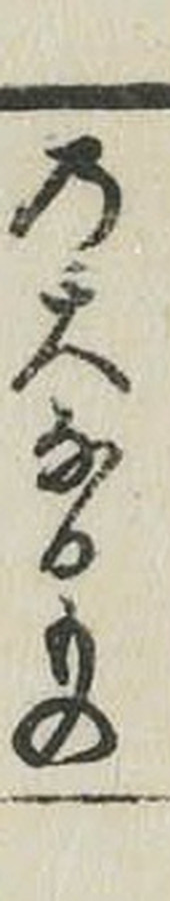の大なるもの
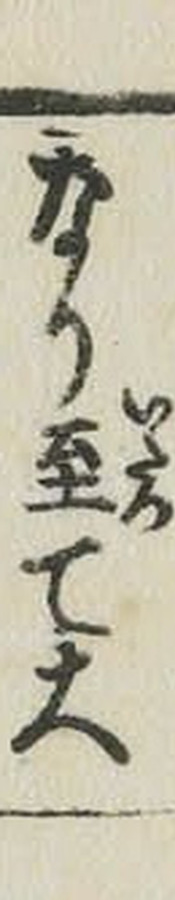なり至て大
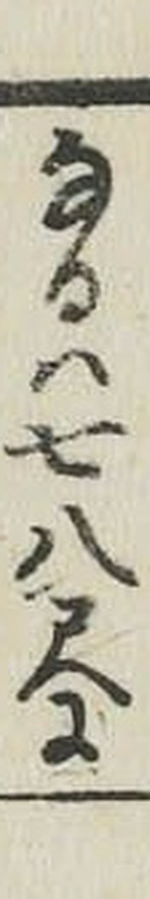なるは七八尺に
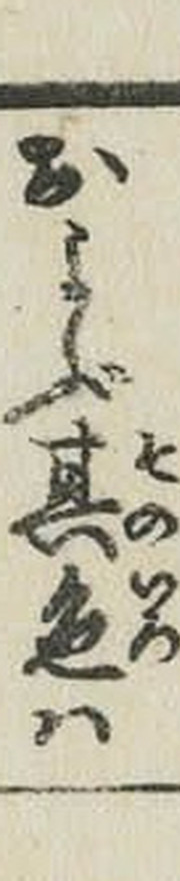およぶ其色は
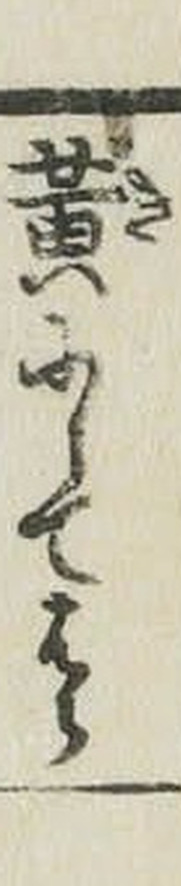黄にしてはら
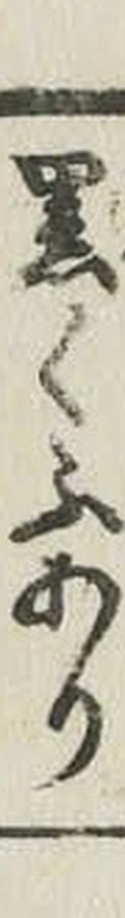黒くふあり
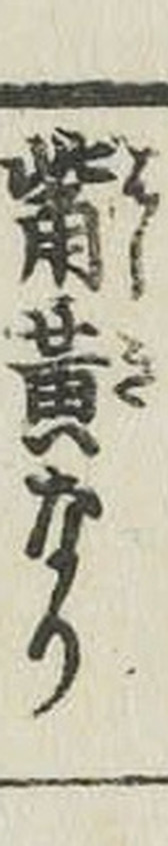觜黄なり
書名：増補頭書訓蒙図彙大成 10巻 6:巻之12-13
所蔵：東京学芸大学教育コンテンツアーカイブ
